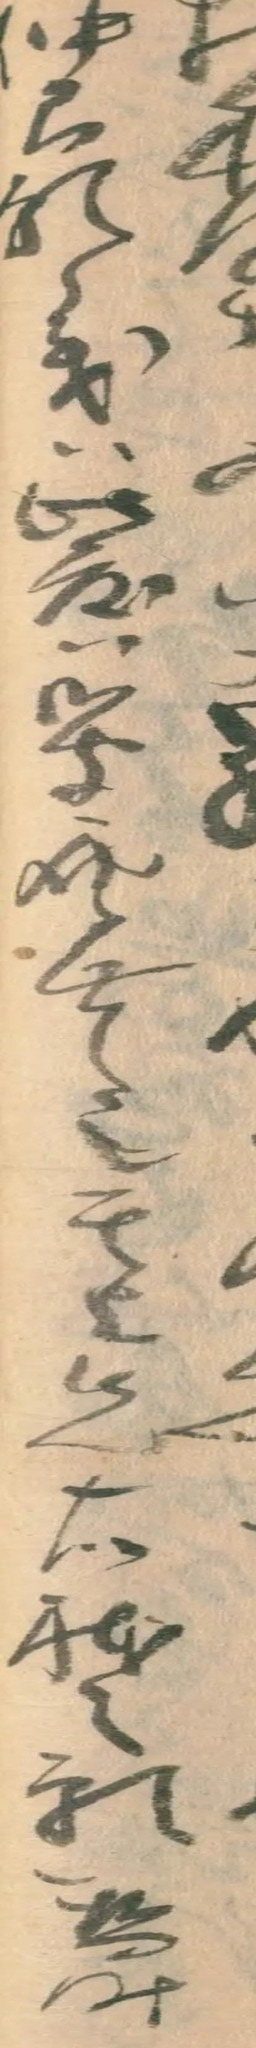仲間願之義ハ此度ハ御聞届無之也其上先右体之願暫時
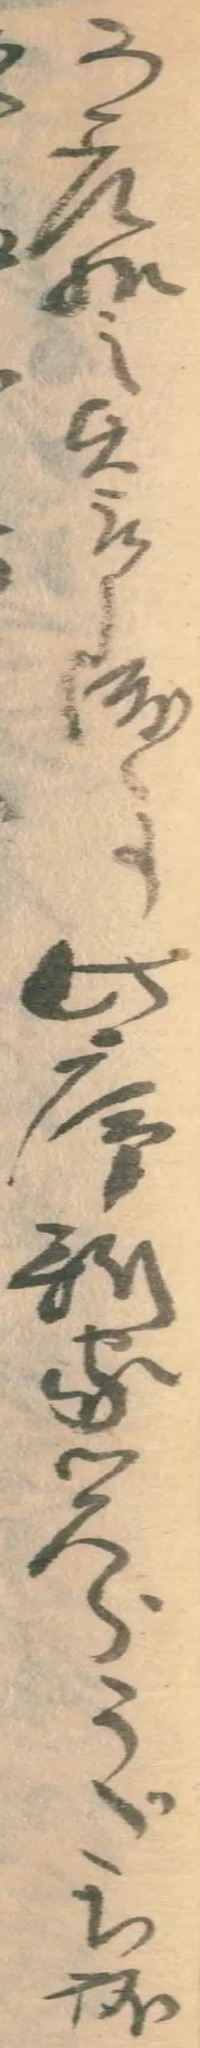可差扣之旨被申渡候事此序新家御見分うだち御
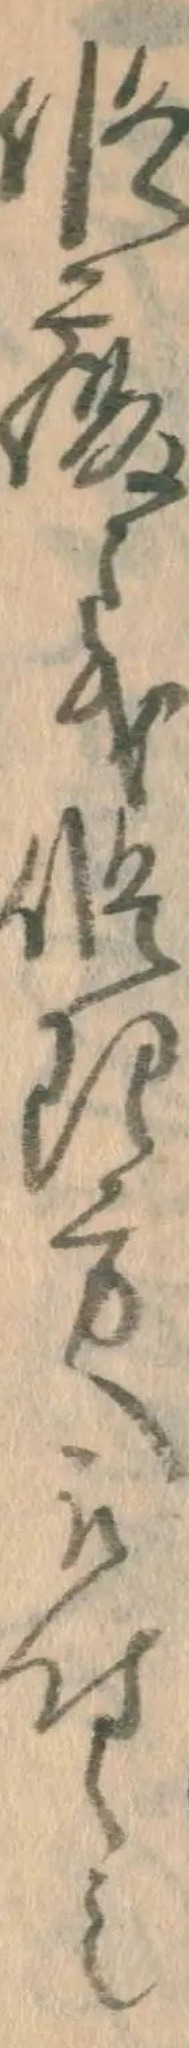修覆之義修理方へ被付候也
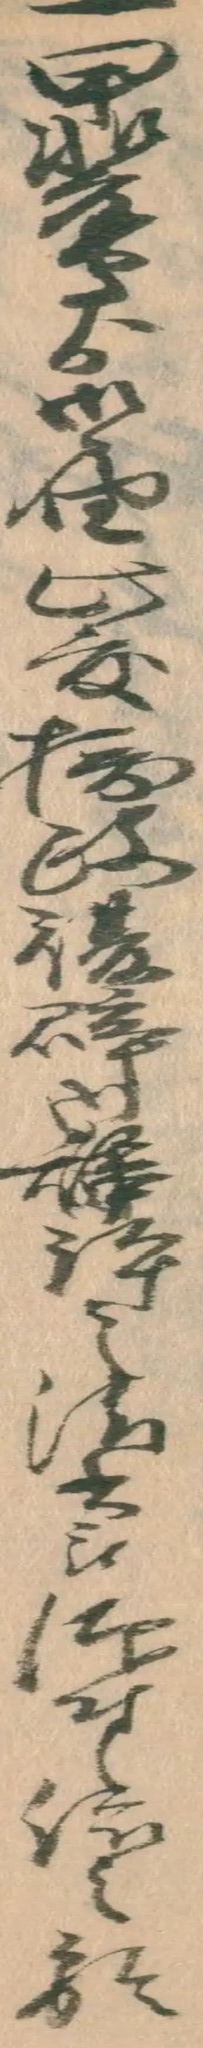一甲斐守ゟ御届此度摂政復辟御辞評之請書被仰付候依之於
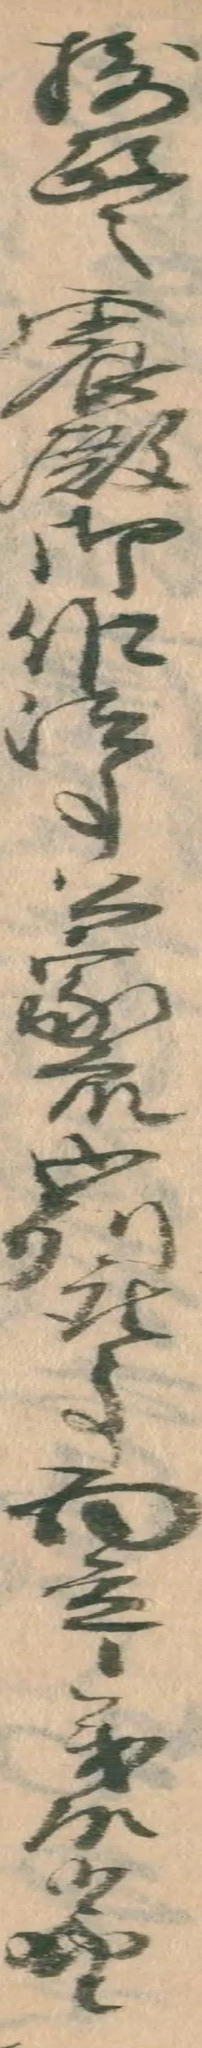摂政之震殿御作法事公家衆御列座事面立候義故
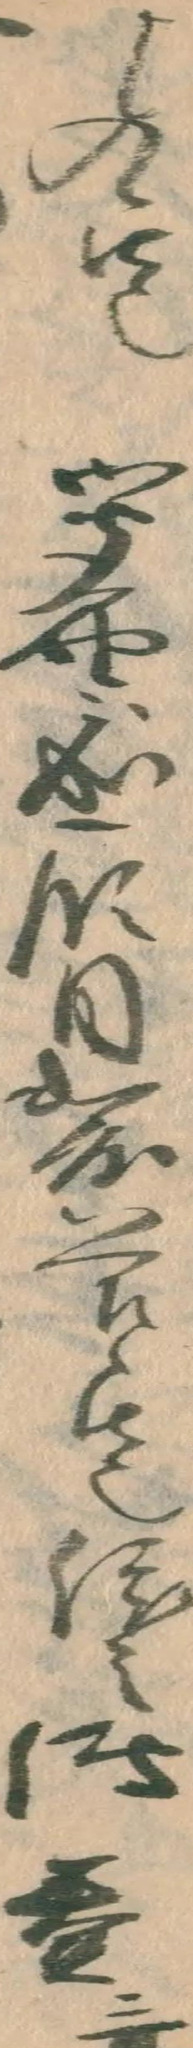申入候由也御聞届被成一段目出度思召候由也依之伝奏并
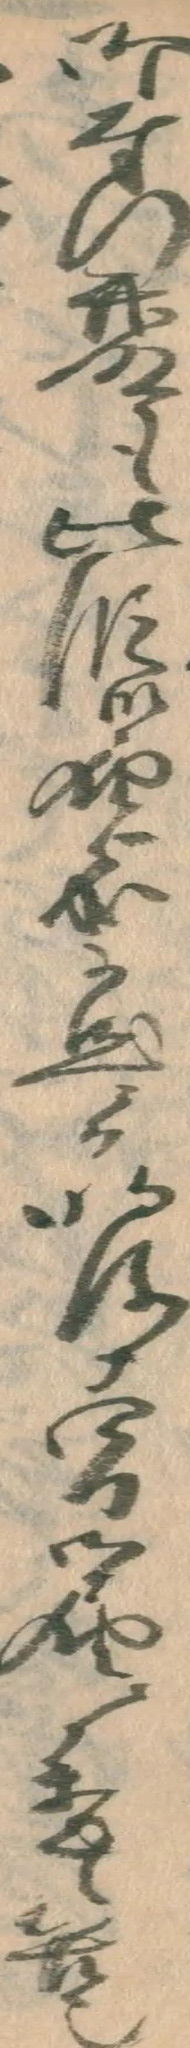御奉行弁殿へも此段御届被成可然ニ而明後十四日御届ニ参上候筈也
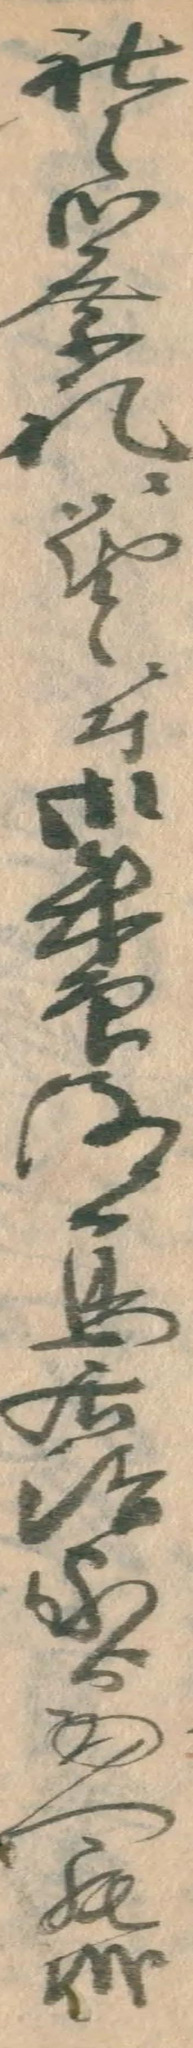社之御祭礼ニ御座候ニ付御朱印役ニ而鳥居大路家ゟ両人罷越
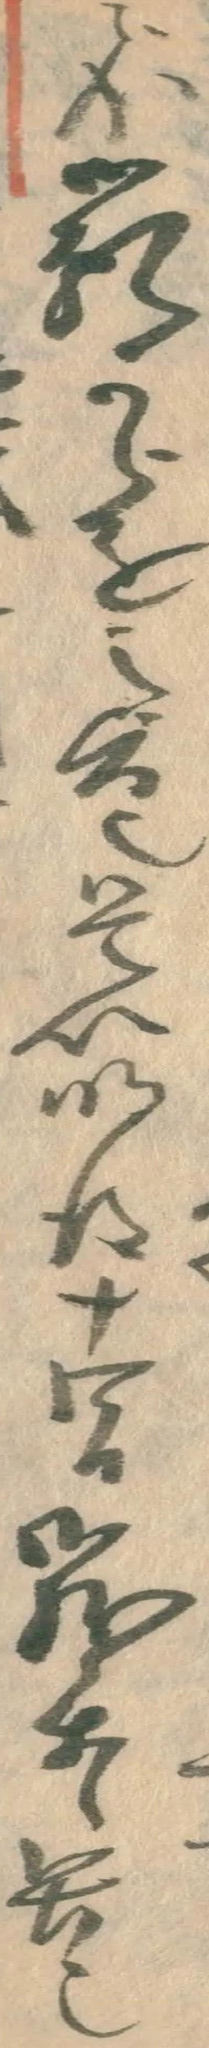被成御願可被進之旨也是以明後十四日御候筈也
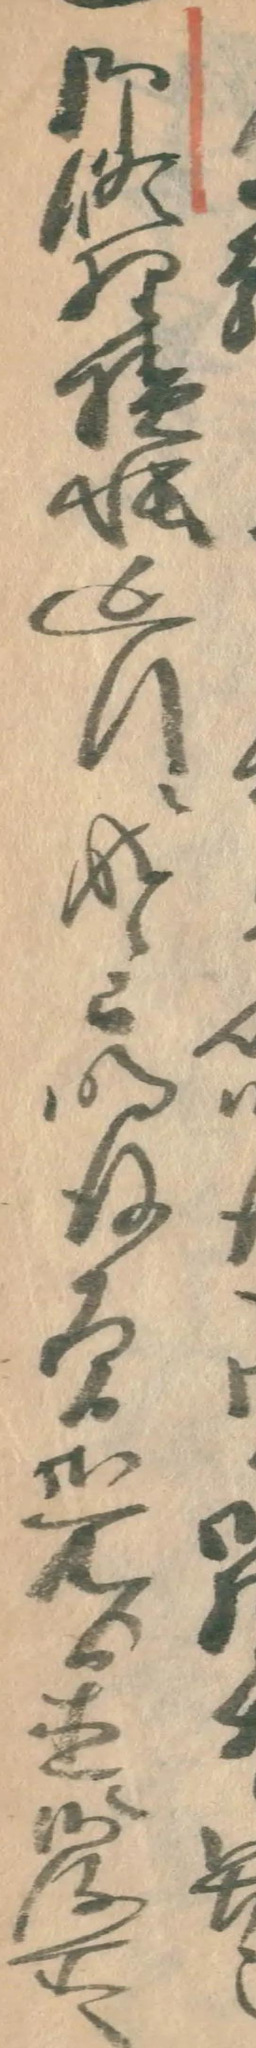一御修理積帳延引ニ成候間明後十四日御兀ゟ直ニ御役所へ

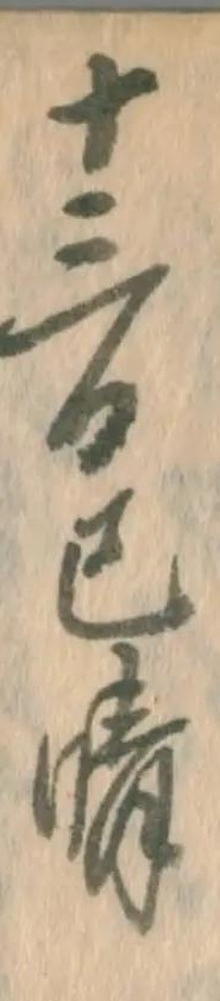十三日己晴
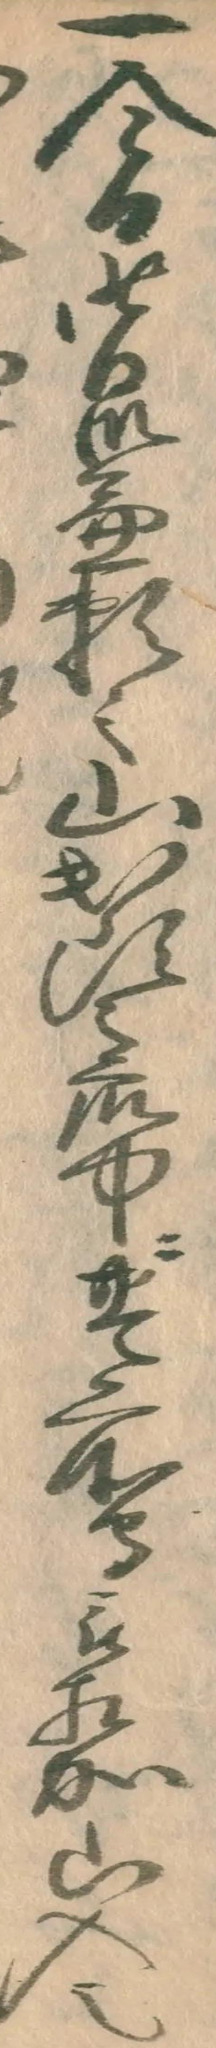一今日昨日御兼頼之山出頭之衆中ニ豊前守被相加山入也
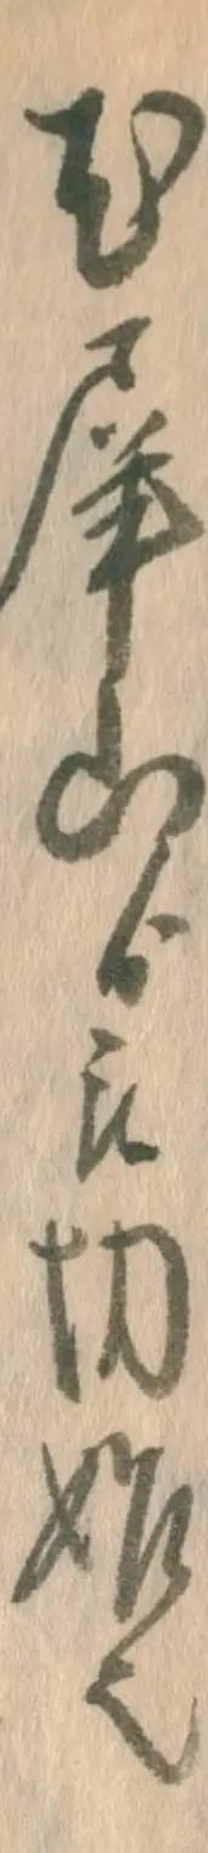尤山ゟ被切始也
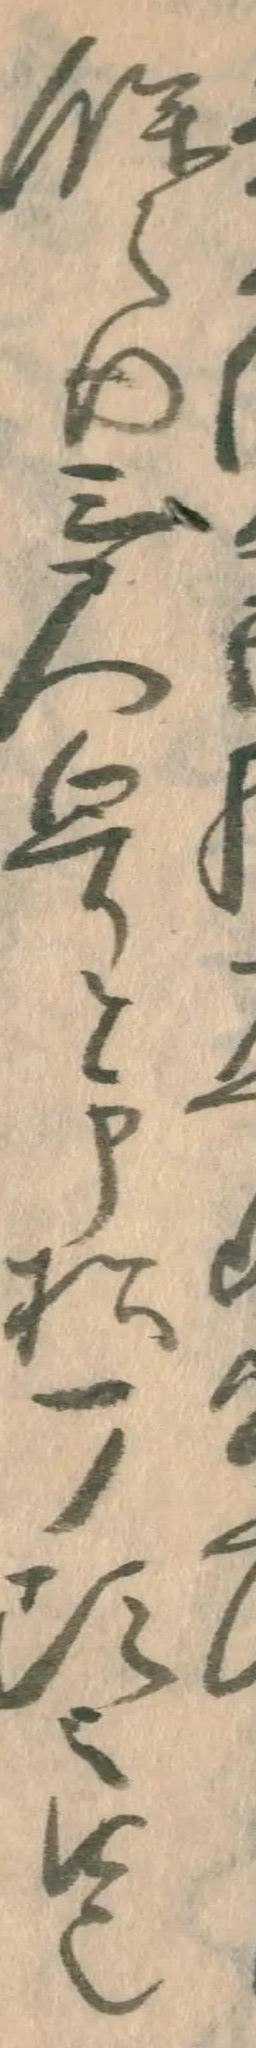余之内三尺廻りと申松一ノ頭之由也
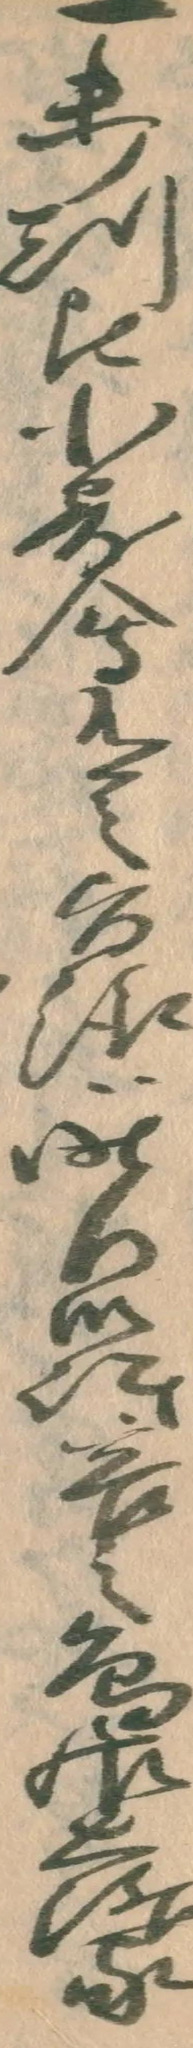一未ノ刻比小寄会有之旨趣ハ昨日御許容之鳥居大路家
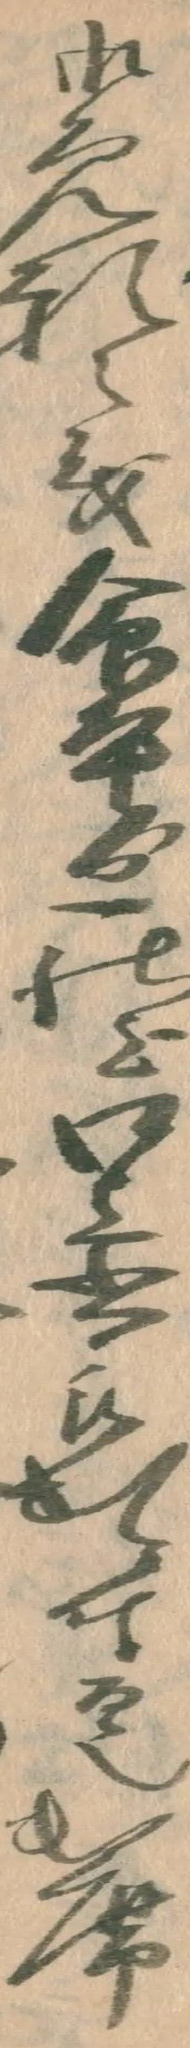御免願之義命平ゟ一社迄口上書被出候ニ付而也出席
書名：賀茂社記録. 第60冊
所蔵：国立国会図書館 National Diet Library, JAPAN
